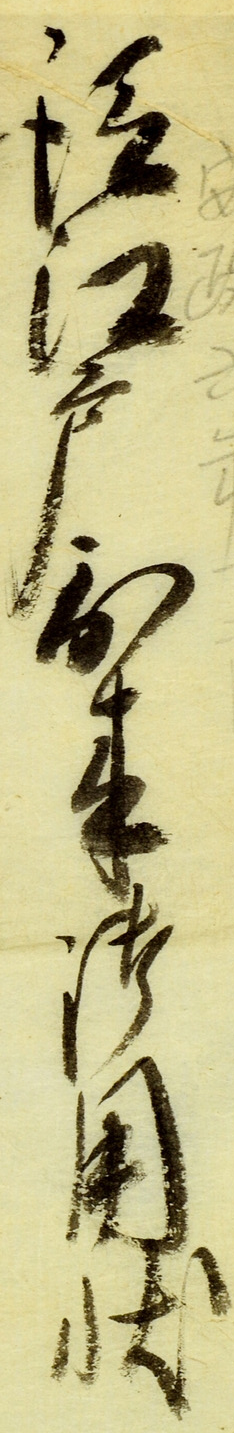従江戸到来御用状
